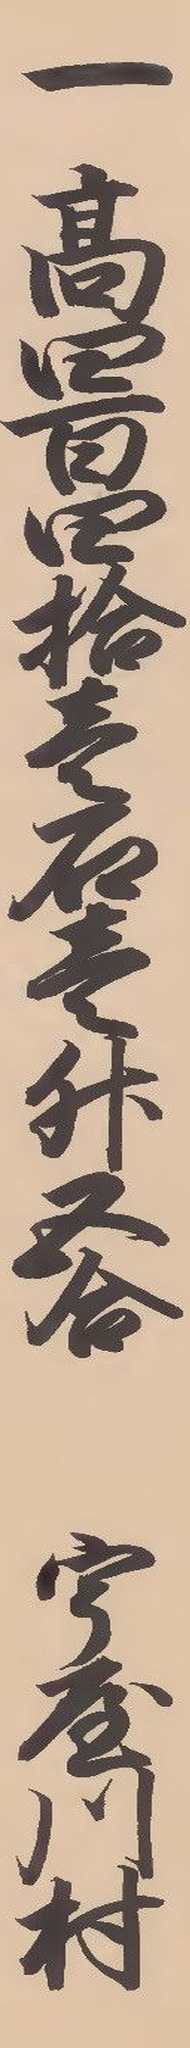一髙四百四拾壱石壱升五合宇屋川村
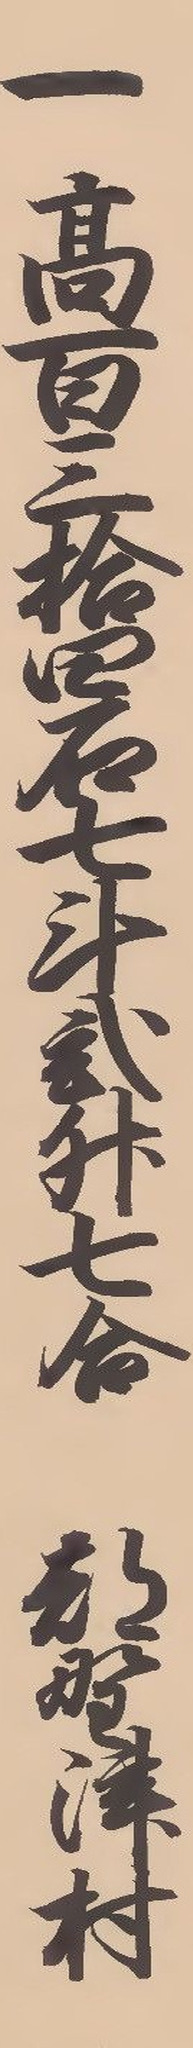一髙百三拾四石七斗弐升七合都野津村
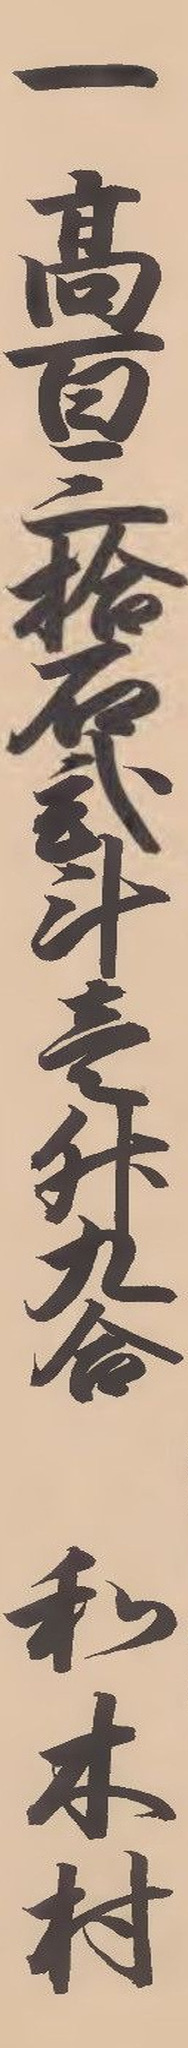一髙百三拾石弐斗壱升九合和木村
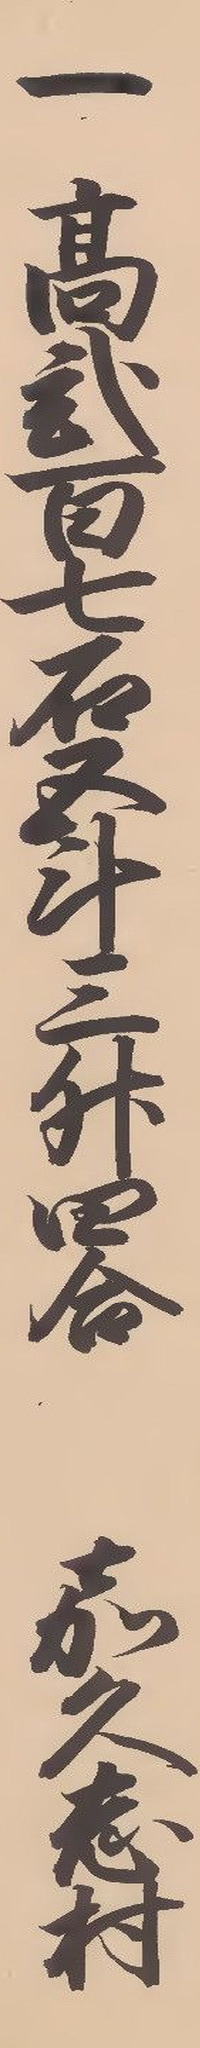一髙弐百七石五斗三升四合嘉久志村
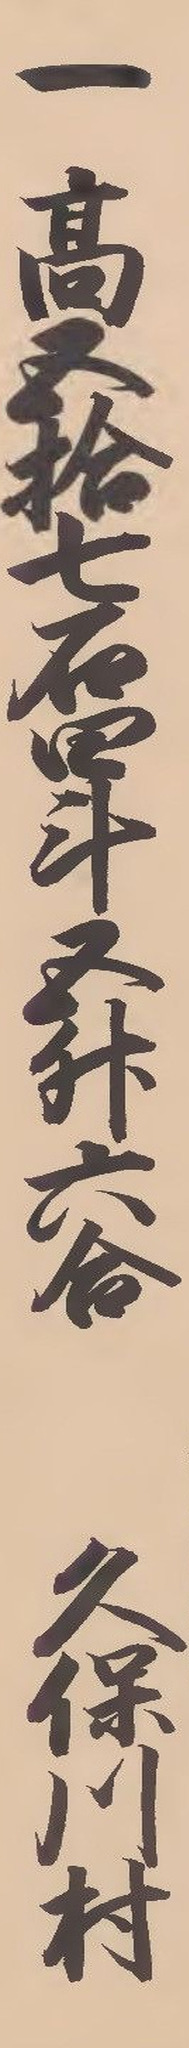一髙五拾七石四斗五升六合久保川村

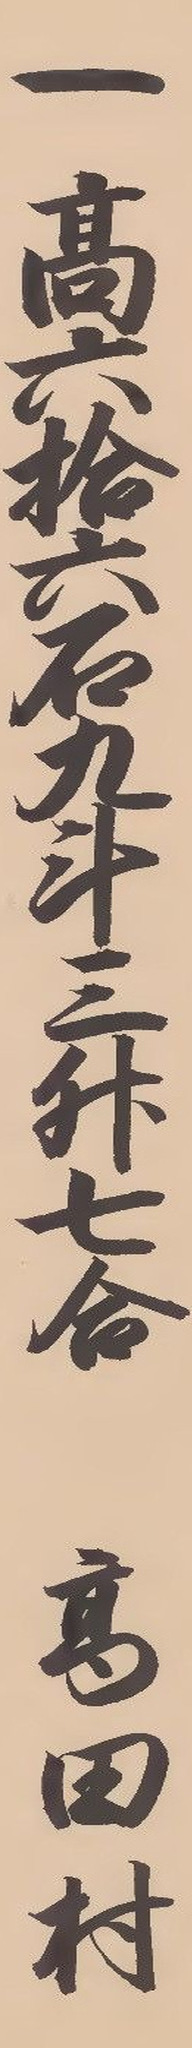一髙六拾六石九斗三升七合髙田村
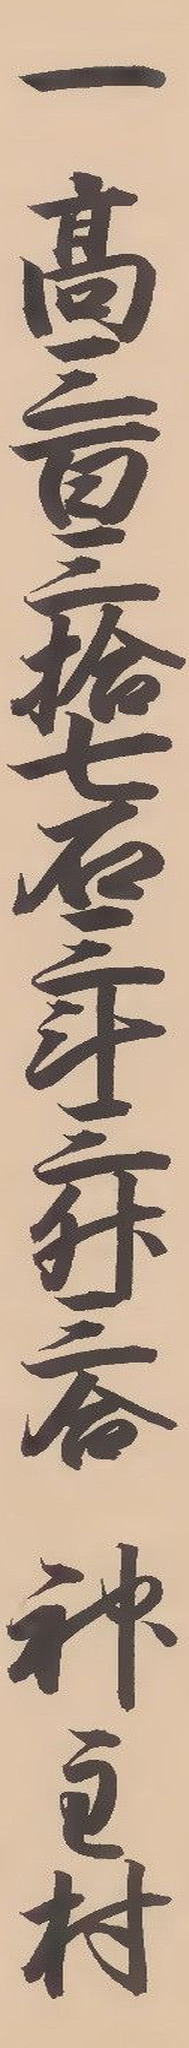一髙三百三拾七石三斗三升三合神主村
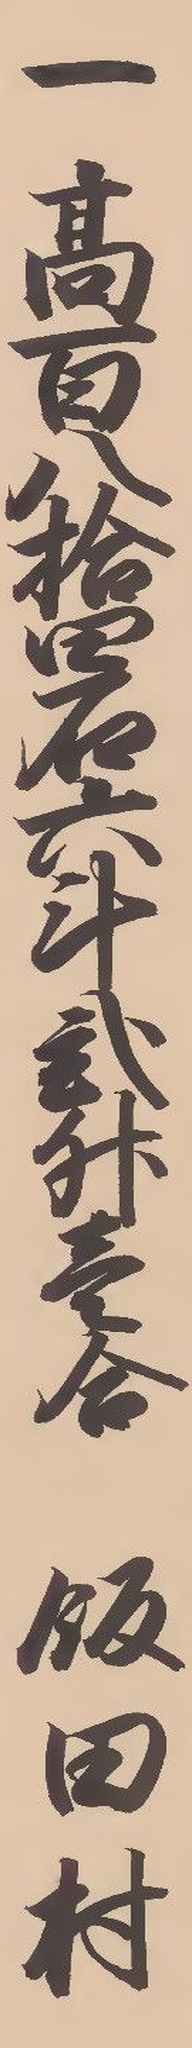一髙百八拾四石六斗弐升壱合飯田村
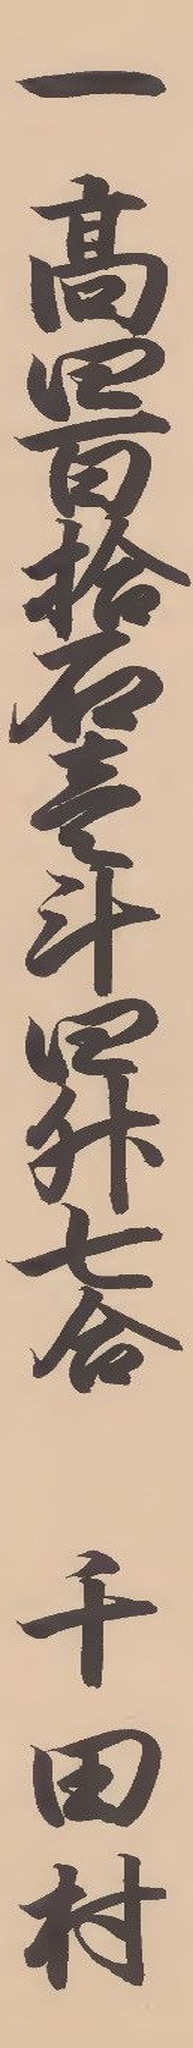一髙四百拾石壱斗四升七合千田村
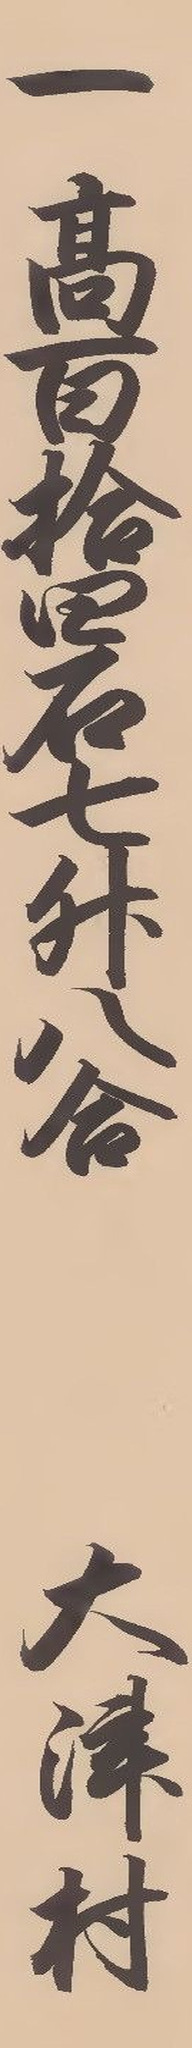一髙百拾四石七升八合大津村
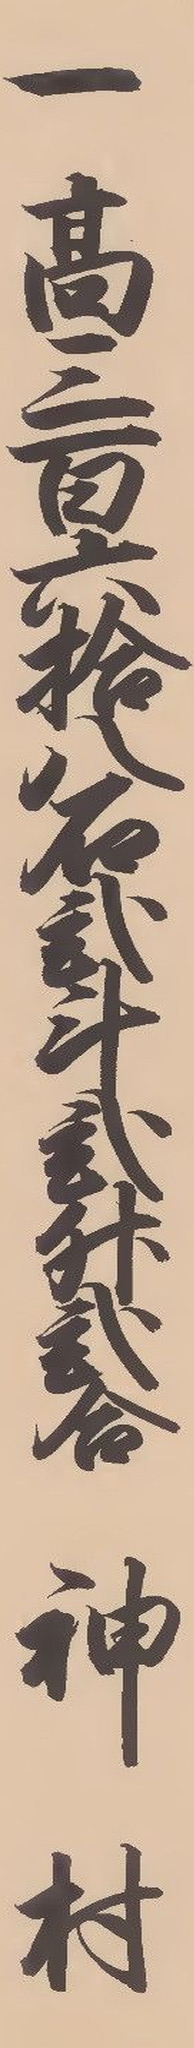一髙三百六拾八石弐斗弐升弐合神村
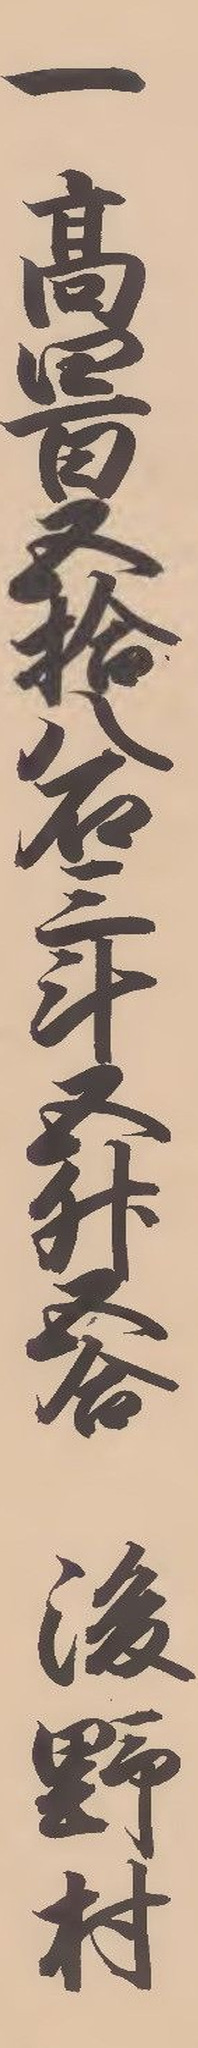一髙四百五拾八石三斗五升五合後野村

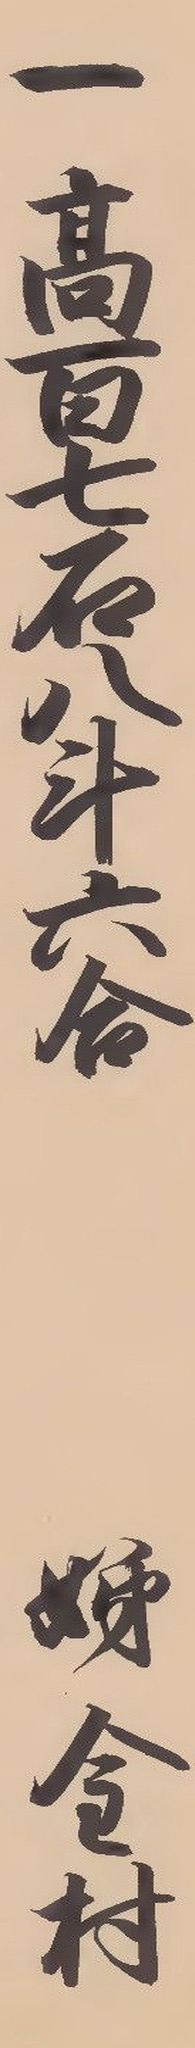一髙百七石八斗六合姉金村
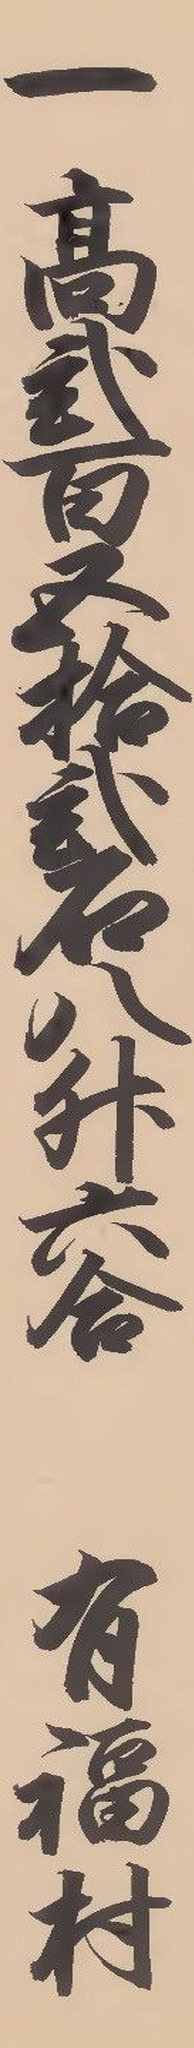一髙弐百五拾弐石八升六合有福村
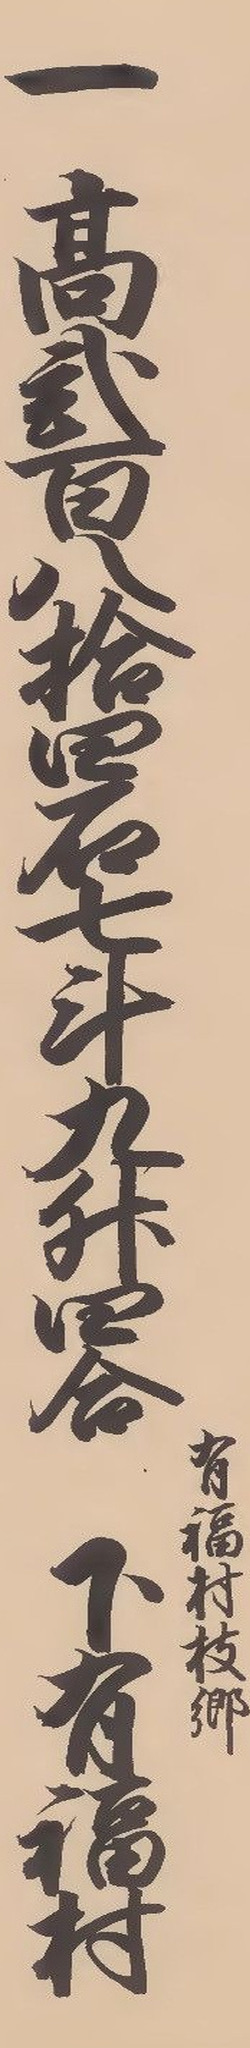一髙弐百八拾四石七斗九升四合下有福村
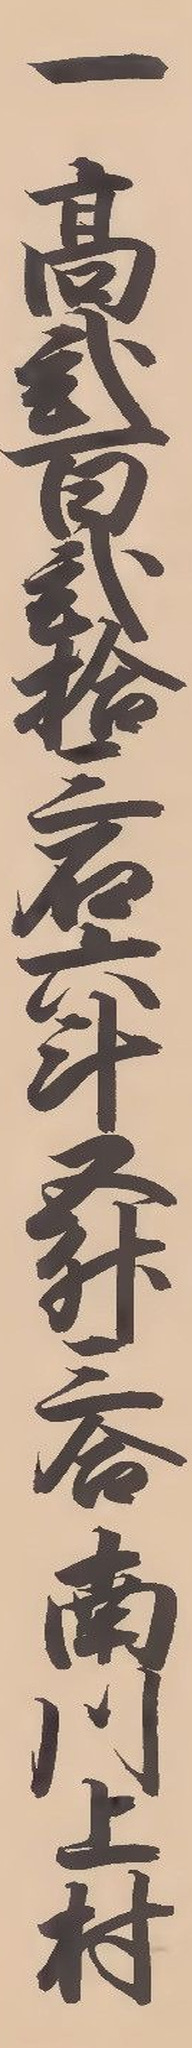一髙弐百弐拾三石六斗五升三合南川上村
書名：石見国郷帳
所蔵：国立公文書館 National Archives of Japan
